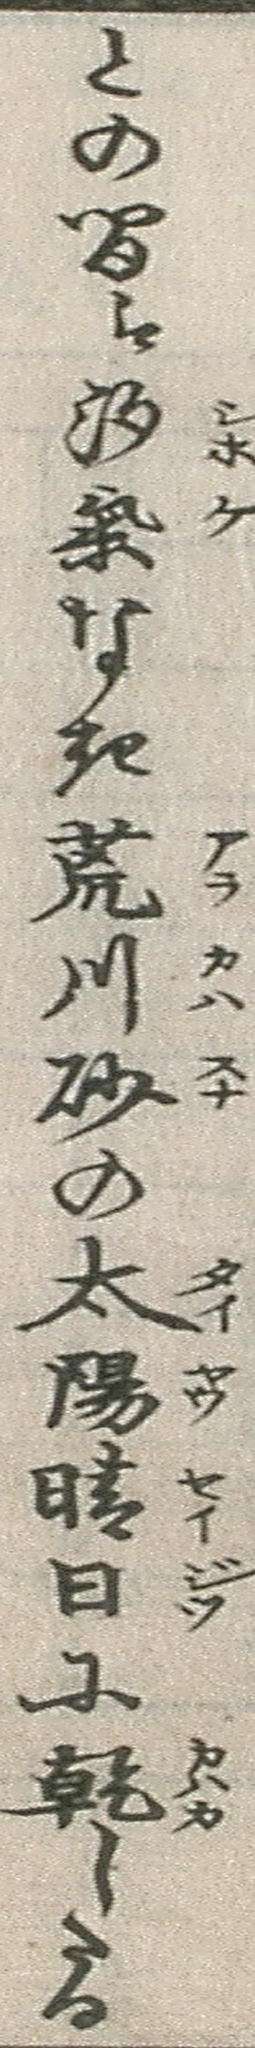との間江汐気なき荒川砂の太陽晴日に乾したる
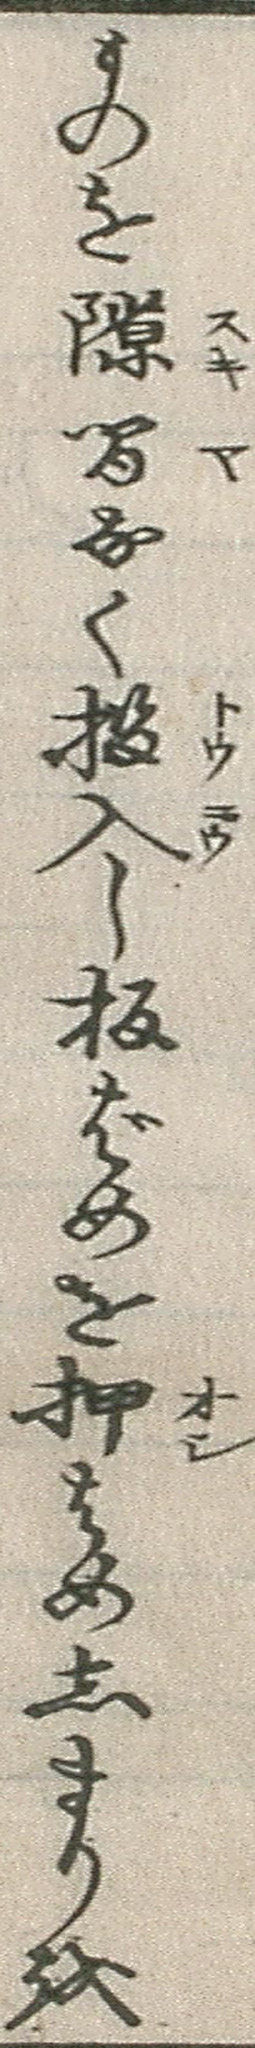ものを隙間なく投入し板ばめを押はめしまりを
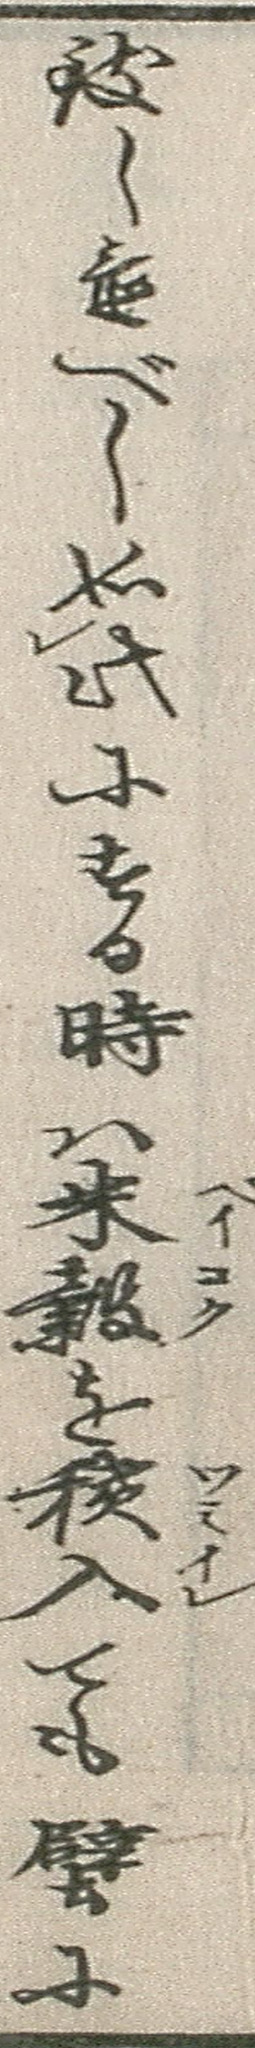致し置べし如此にする時は米穀を積入ても壁に
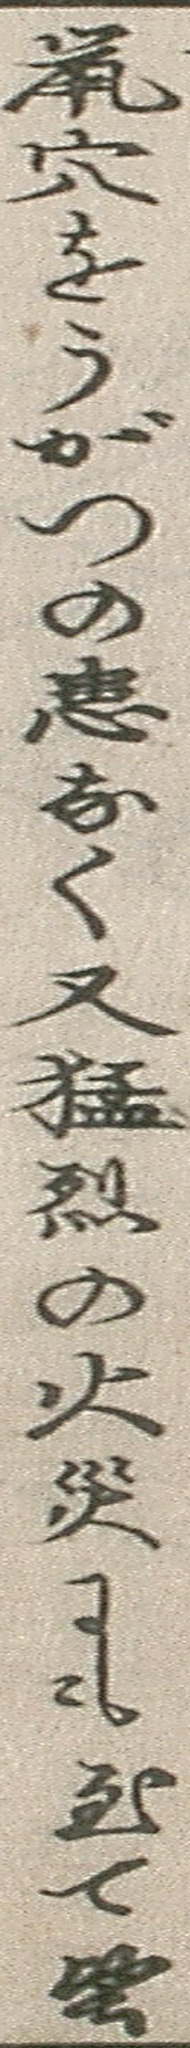鼠穴をうがつの患なく又猛烈の火災にも至て堅
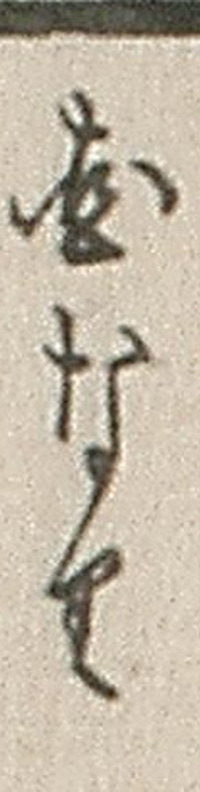固なり
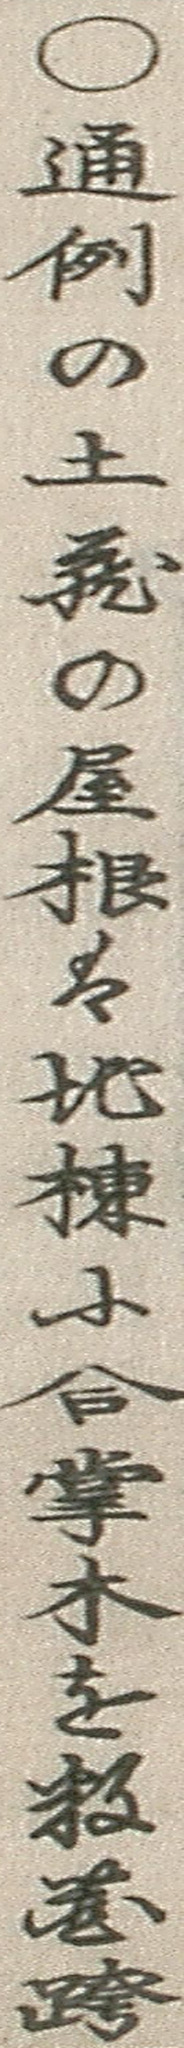〇通例の土蔵の屋根は地棟に合掌木を数箇跨
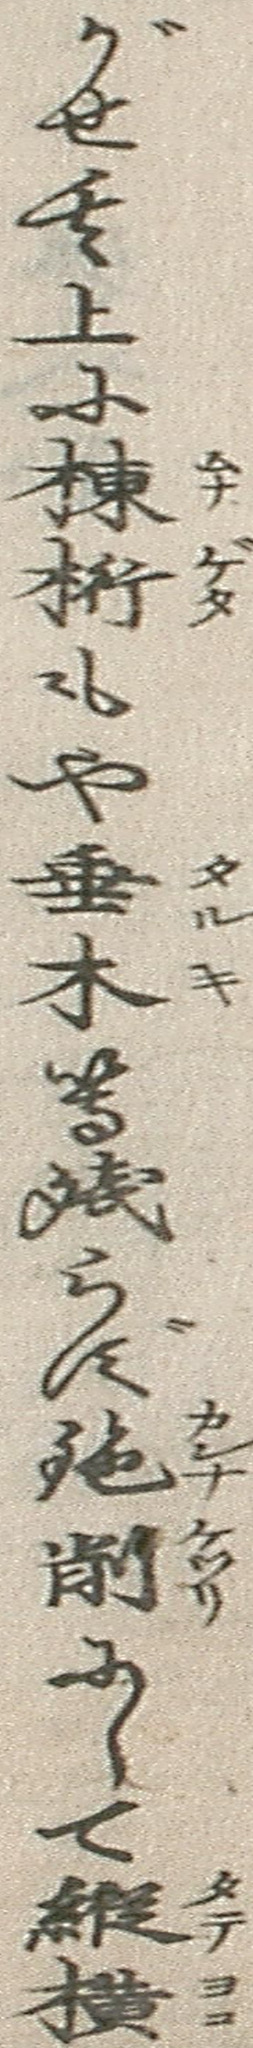がせ其上に棟桁もや垂木等残らず鉋削にして縦横
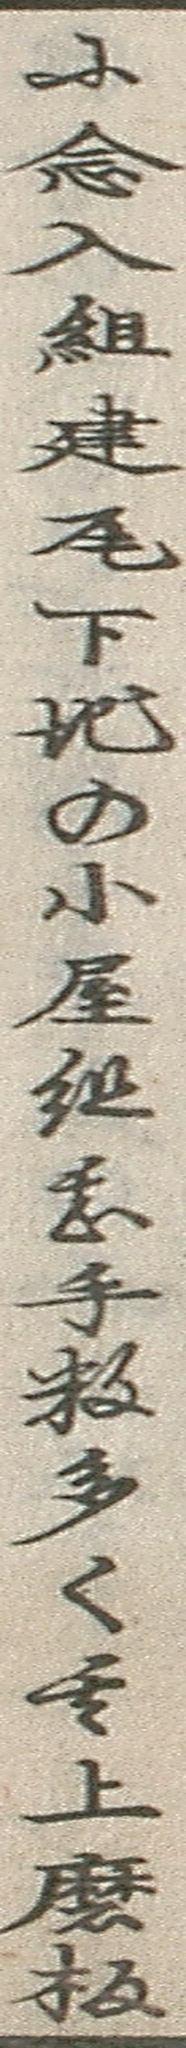に念入組建瓦下地の小屋組甚手数多く其上磨板
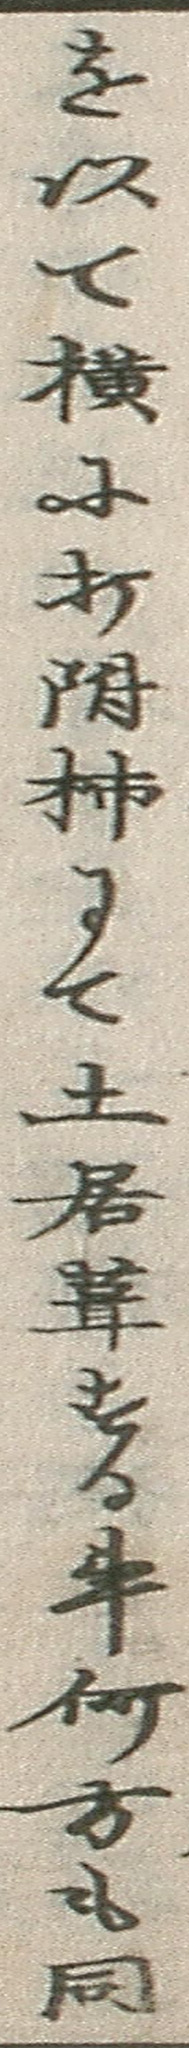を以て横に打附杮にて土居葺する事何方も同
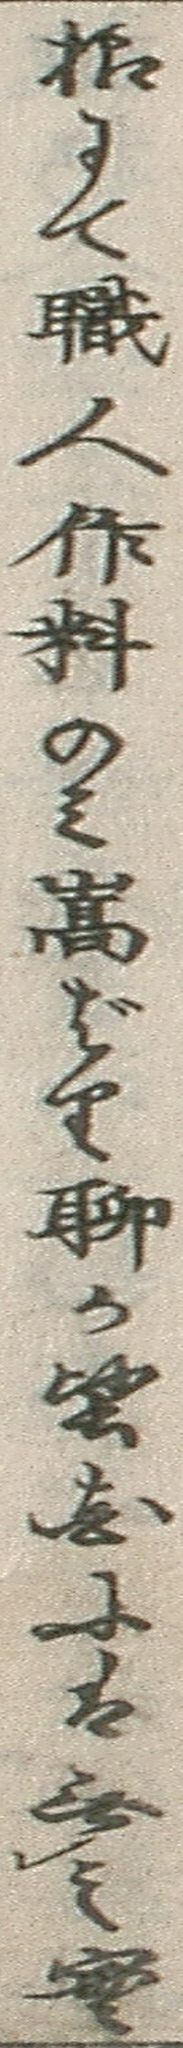様にて職人作料のみ嵩ばり聊か堅固には無之実
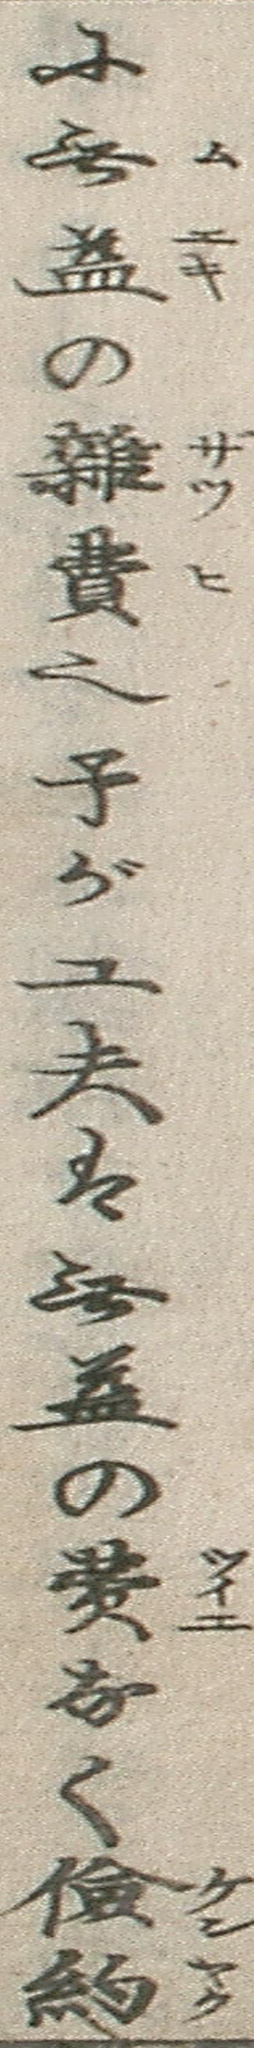に無益の雑費也予が工夫は無益の費なく倹約

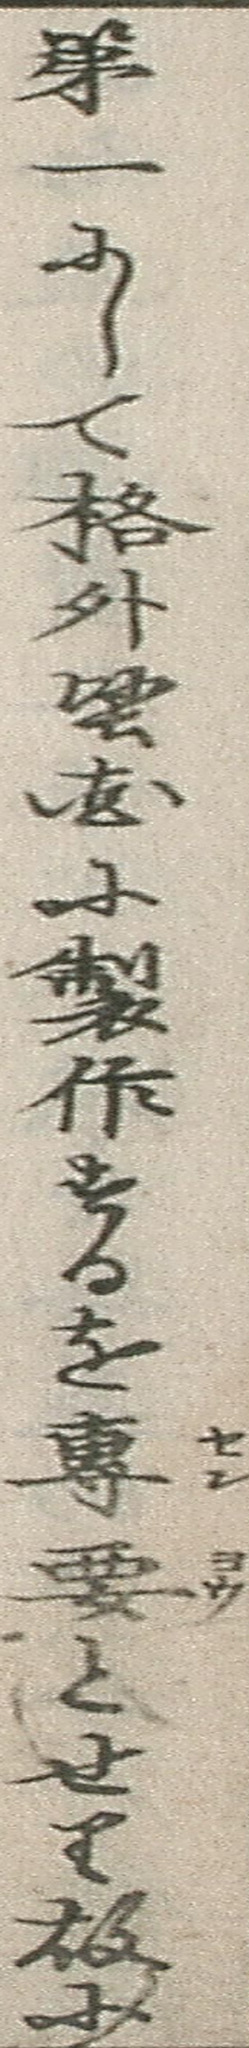第一にして格外堅固に製作するを専要とせり故に
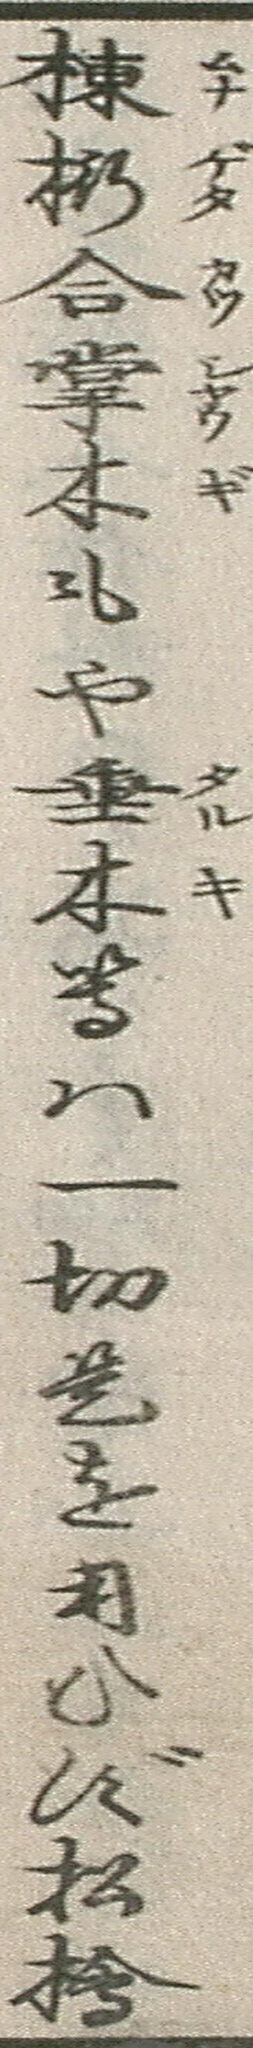棟桁合掌木もや垂木等は一切是を用ひず松檜
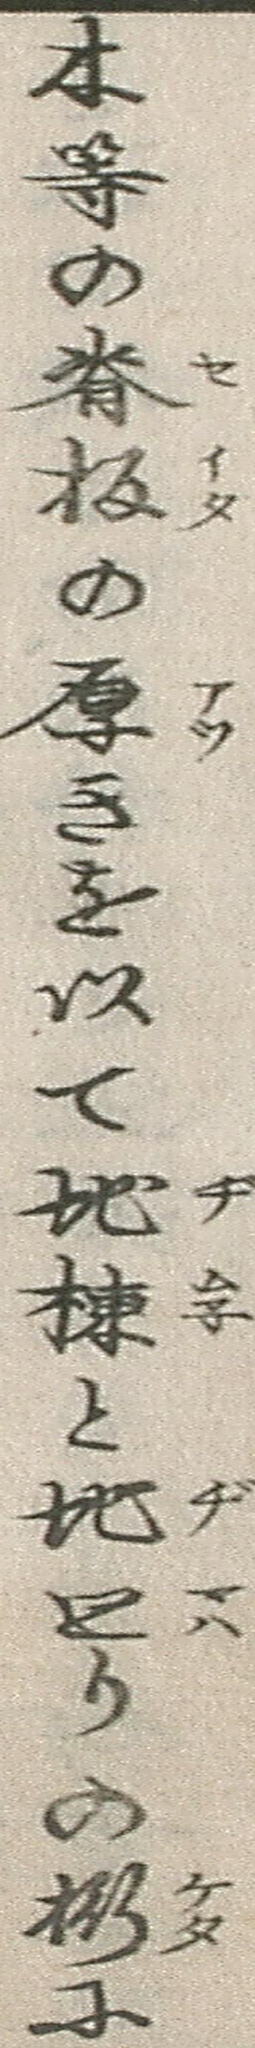木等の背板の厚きを以て地棟と地廻りの桁に
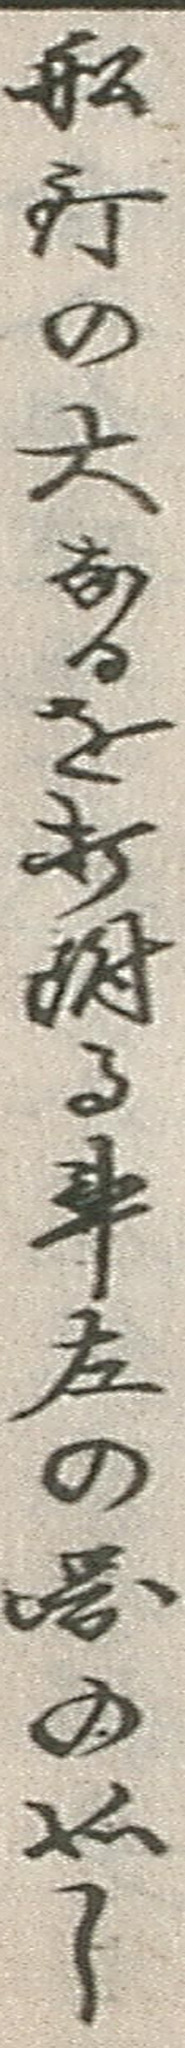船釘の大なるを打附る事左の図の如し
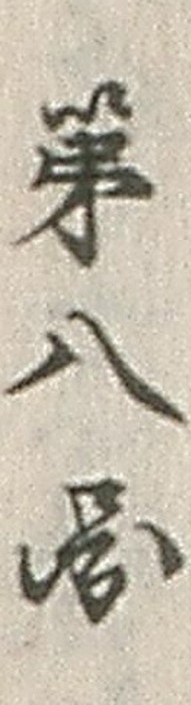第八図
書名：附録　地震劇風災害豫防法圖説（内題）
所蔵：東京大学地震研究所図書室 Earthquake Research Institute Library, The University of Tokyo, JAPAN
